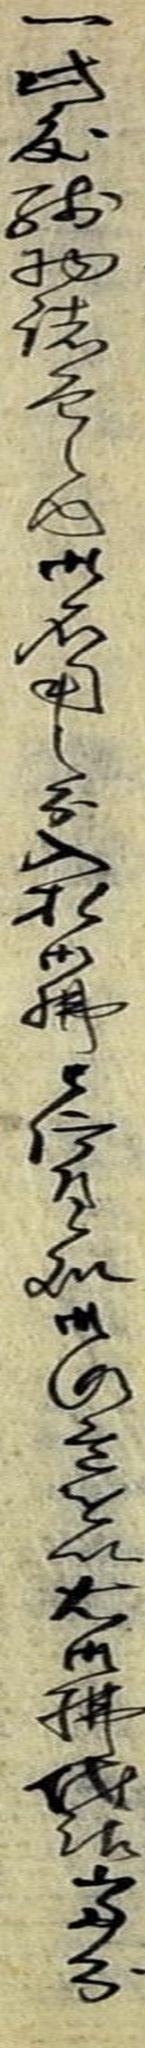一此度残者諸色之内御不用之分入札御払被仰付候処御趣意を以右御払代銀当分
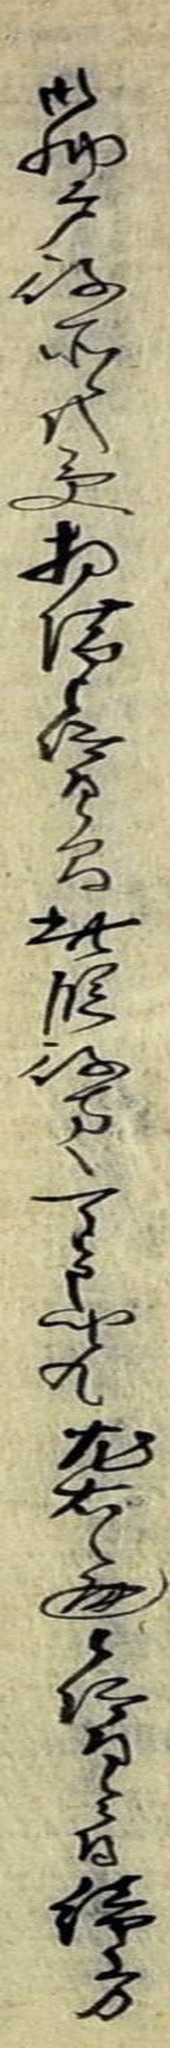御納戸役所へ引受拝借被仰付候間此段役方へ可被申聞候尤右之通被仰付候ニ付締方
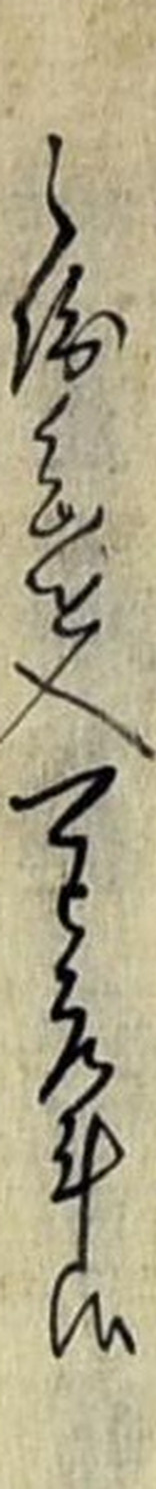之儀念を入可被取計候
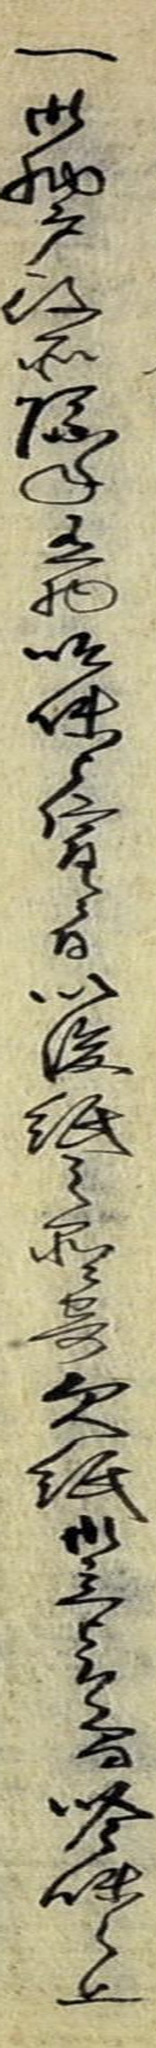一御納戸役所隔年有物吟味被仰付候ニ付以後紙之品ニ寄欠紙御立被下候間吟味之上
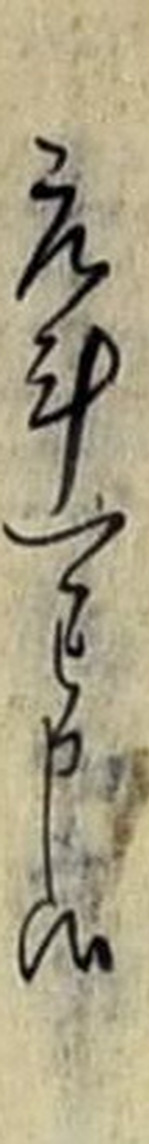取計可被申候
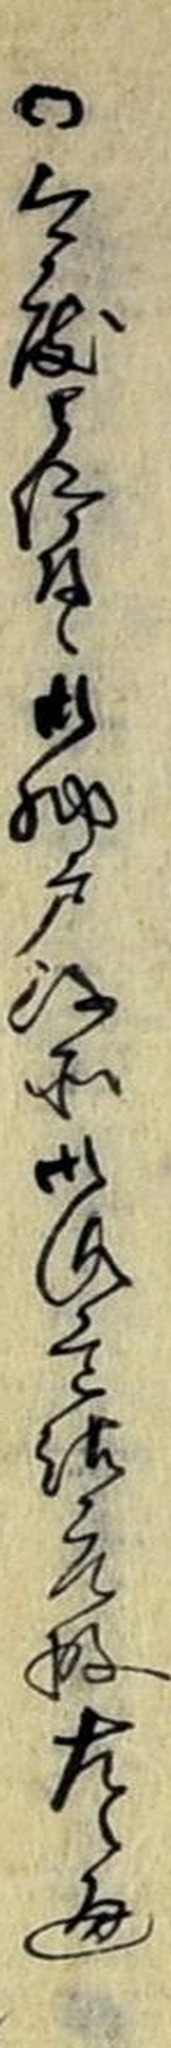〇今度被仰付候御納戸役所御趣意銀取扱左之通
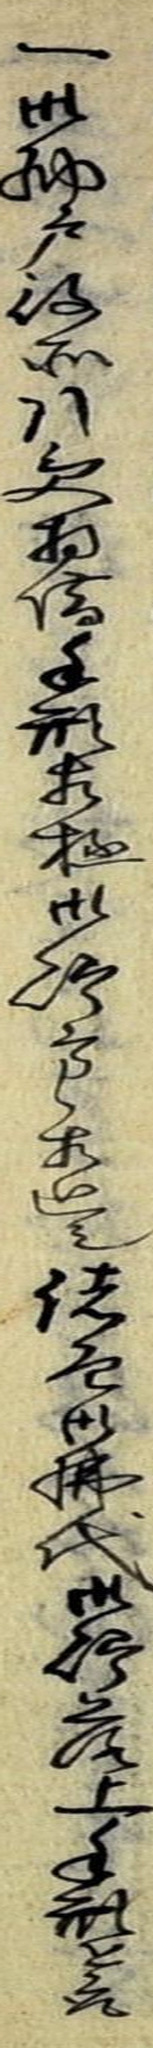一御納戸役所引受拝借手形相極御貯方へ相廻シ諸色御払代御貯落上手形を取
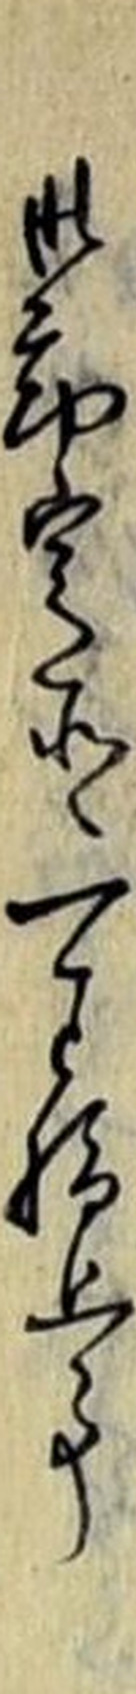御勘定所へ可被指上事
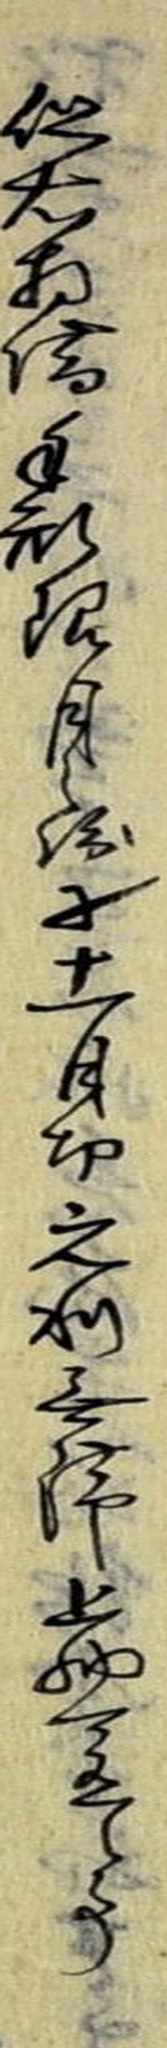但右拝借手形限月之儀寅十一月切元利無滞上納可有之事
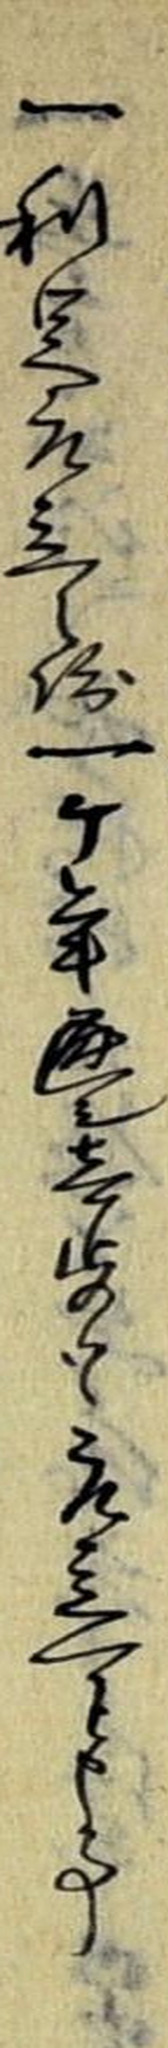一利足取立之儀一ケ年通シ壱歩ツヽ取立可被申事
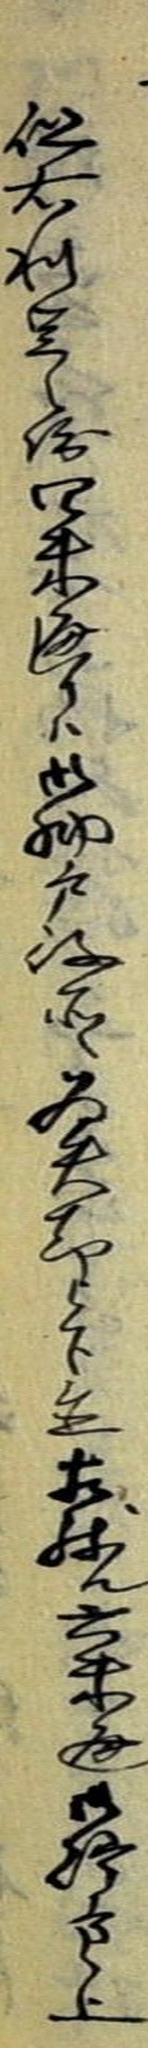但右利足之儀四朱通りハ御納戸役所へ為失却被下置相残ル六朱通御貯方へ上
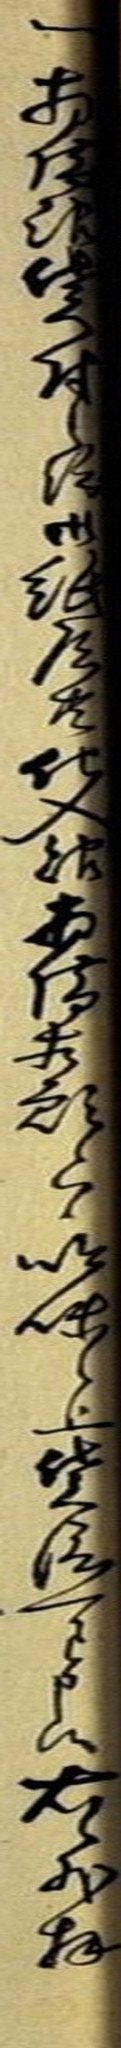一拝借銀貸付之儀御紙屋共仕入銀拝借相願候ハヽ吟味之上貸渡可被申候右之外拝
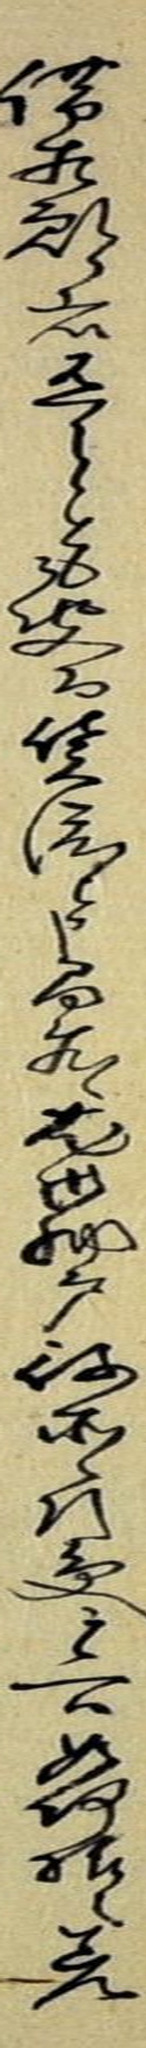借相願候者有之候とも決而貸渡被申間敷候尤御納戸役所へ引受ニ候ヘハ如何様之差
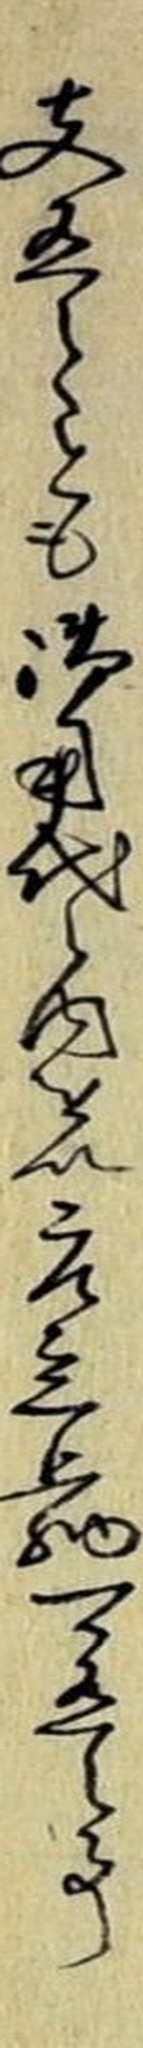支有之候へとも御用代之内を以取立上納可有之事
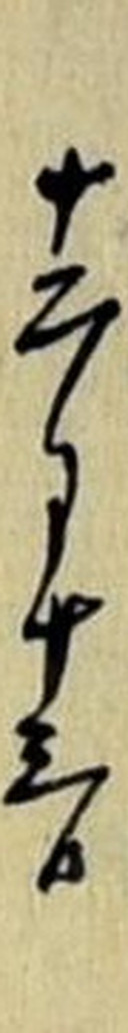十二月十三日
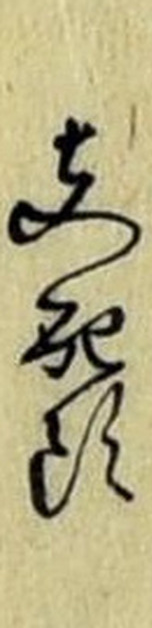支配頭
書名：命令之部 三
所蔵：福井県文書館 Fukui Prefectural Archives
